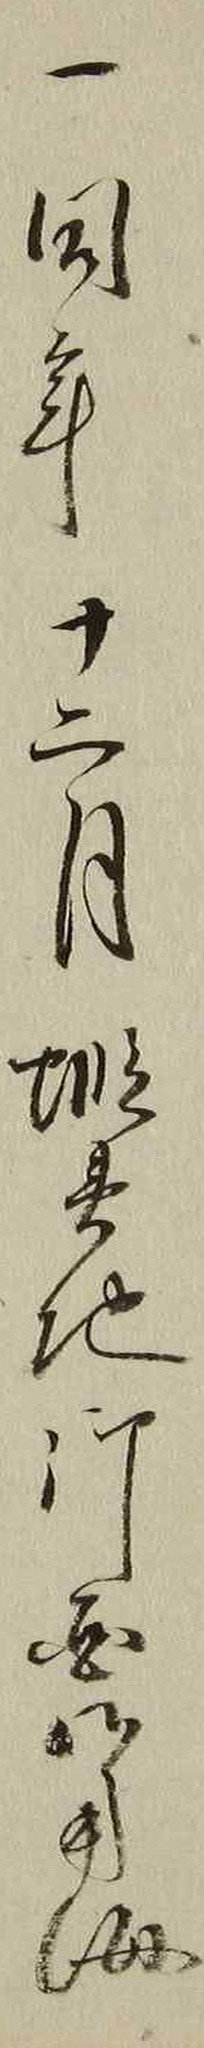一同年十二月蝦夷地御固御用海
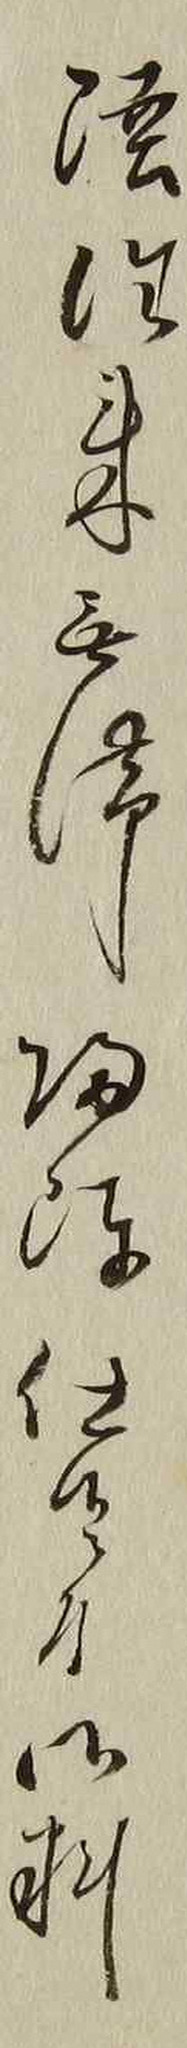陸往来無滞帰陣仕候ニ付御料
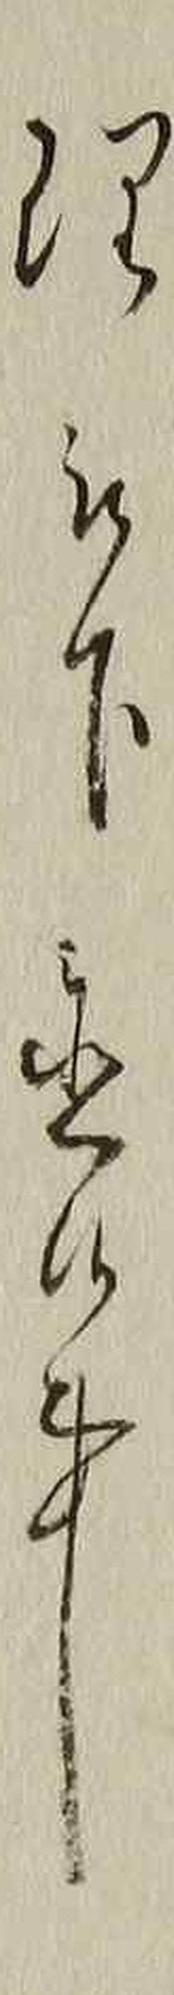理被下置候事
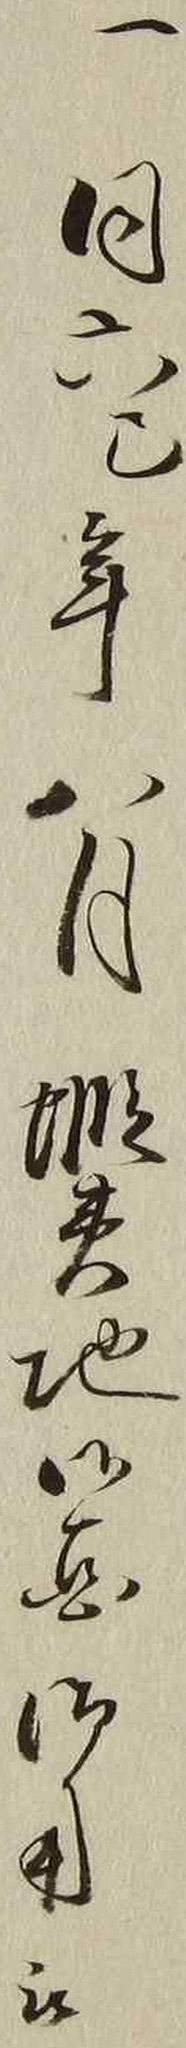一同六巳年八月蝦夷地御固御用被
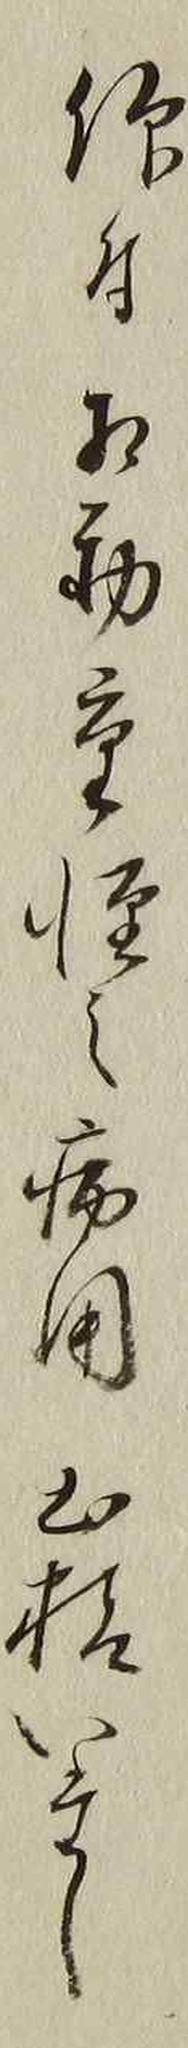仰付相勤重軽之病用出精いたし
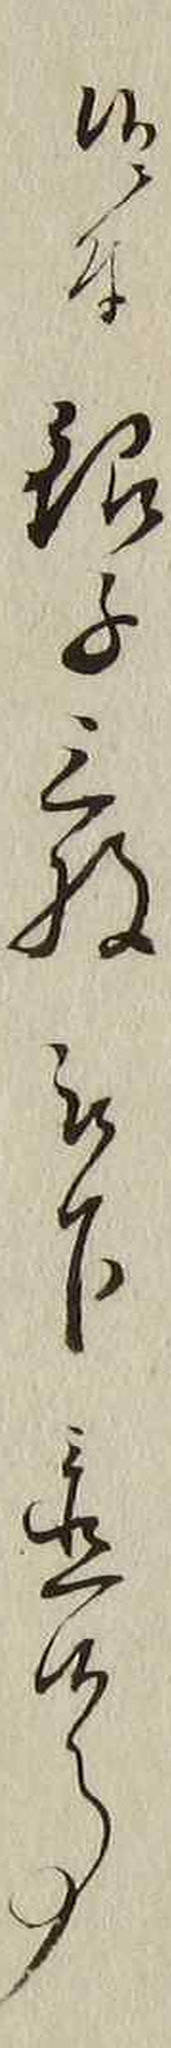候ニ付銀子三枚被下置候事
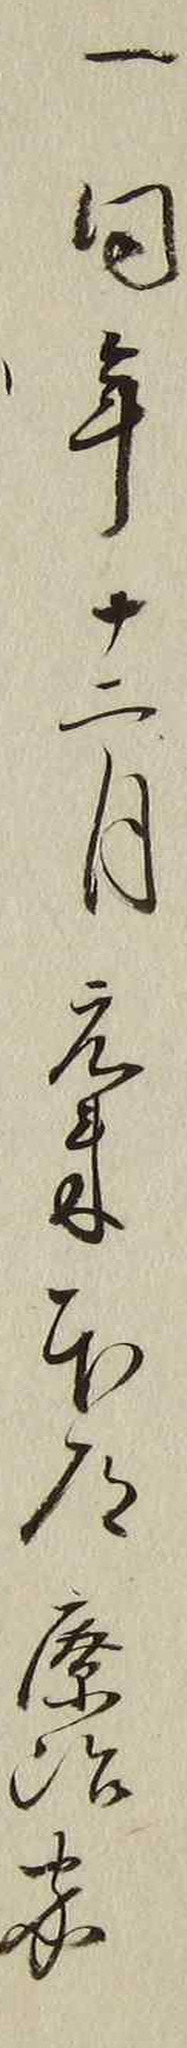一同年十二月元来本道療治家
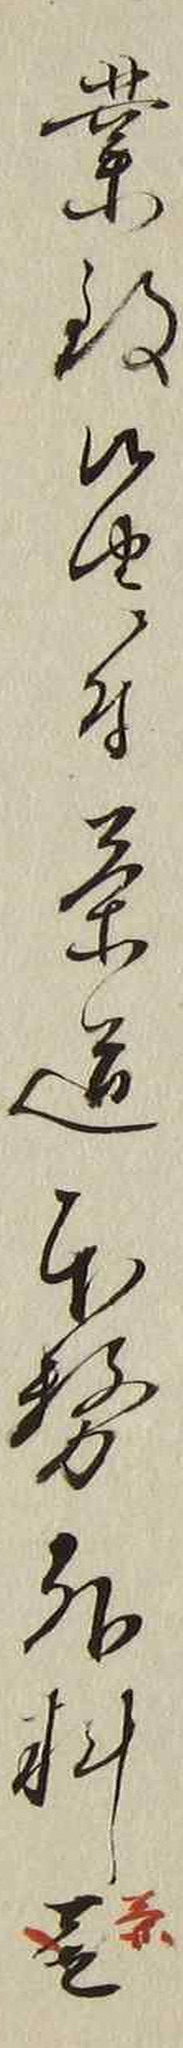業致候由ニ付茶道本務外料兼
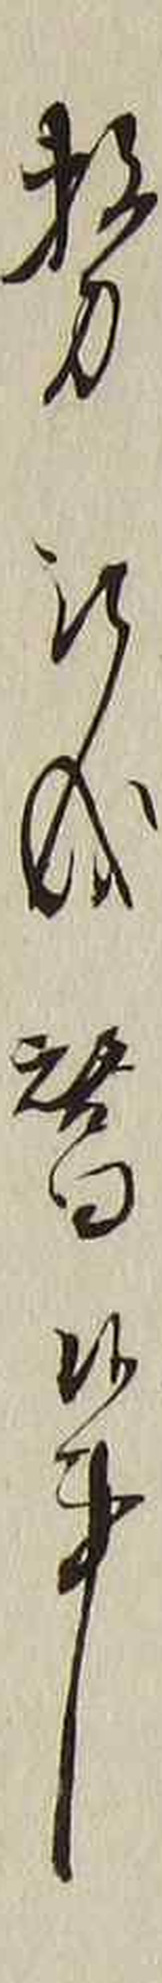務被成替候事
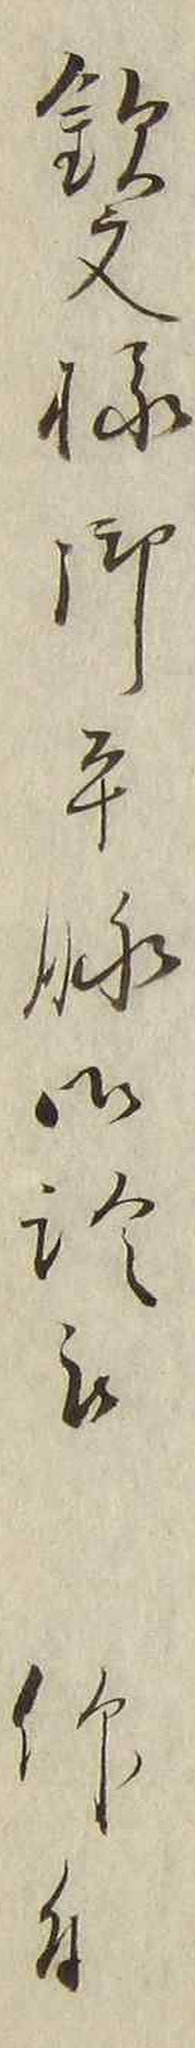欽文様御平脈御診被仰付

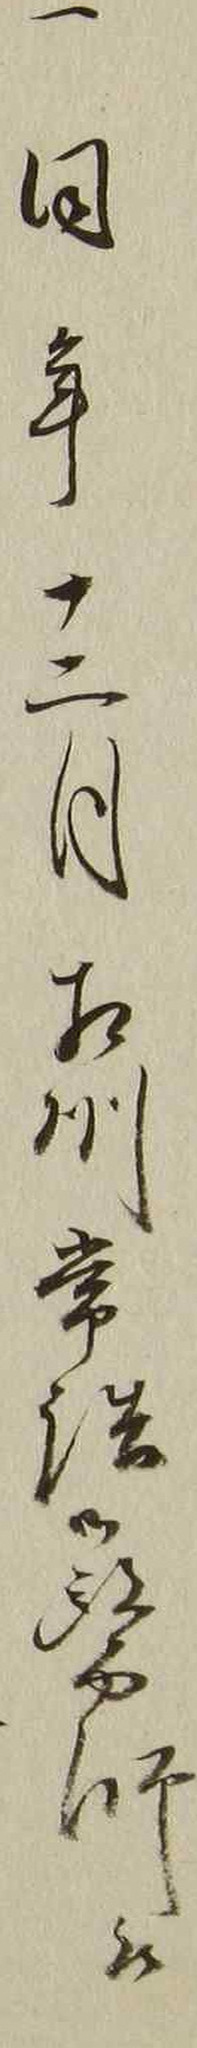一同年十ニ月相州常詰御医師被
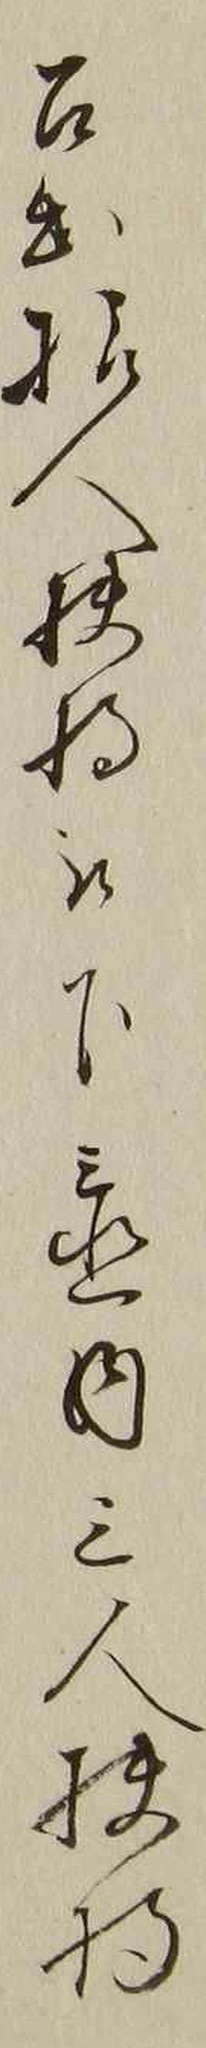召出拾人扶持被下置内三人扶持
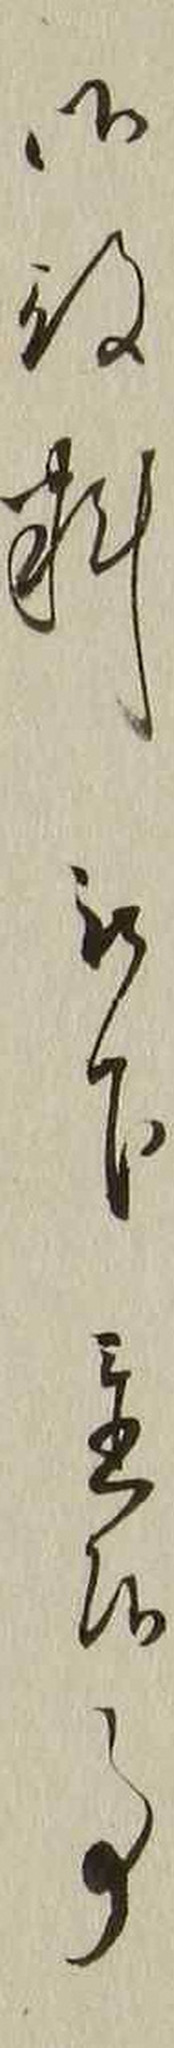御役料被下置候事
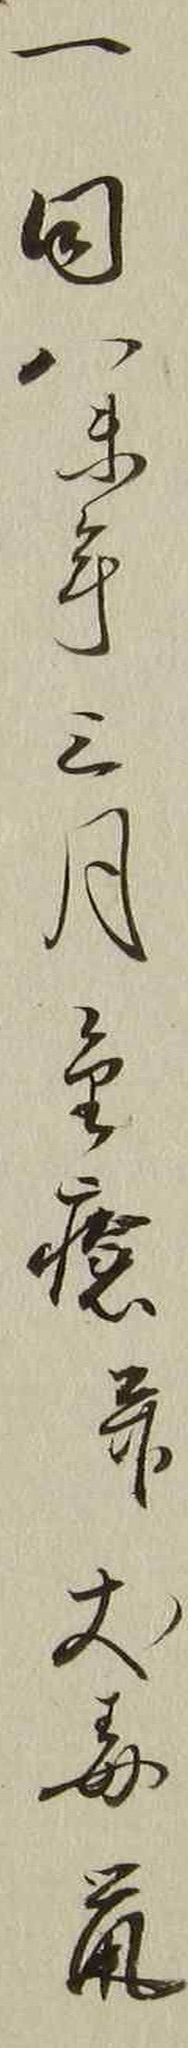一同八未年三月重療幷犬毒鼠
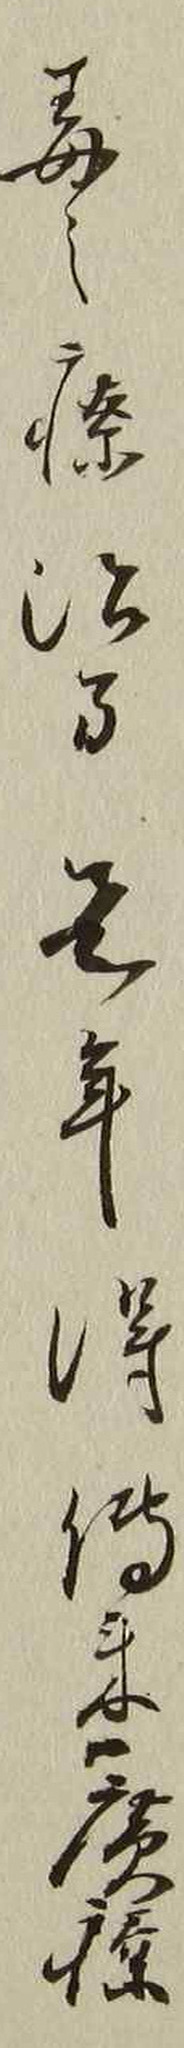毒之療治万先年得伝来広療
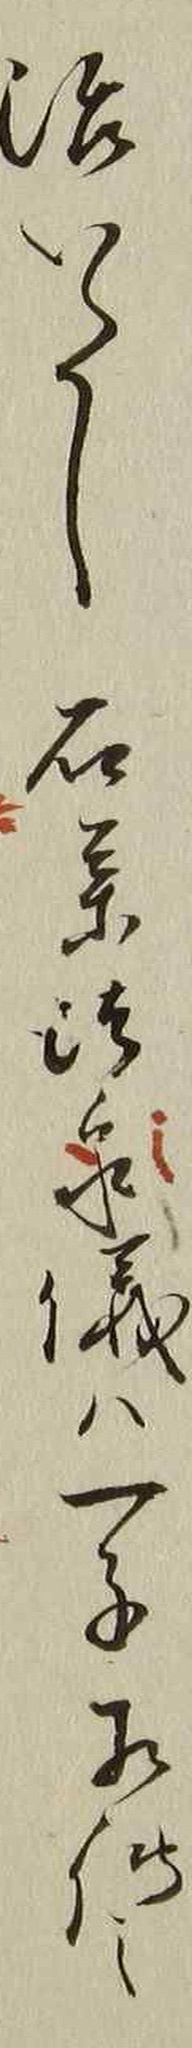治いたし右薬法之儀ハ一子相伝之
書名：諸士系譜　巻之129　た之部5
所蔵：会津若松市立会津図書館
